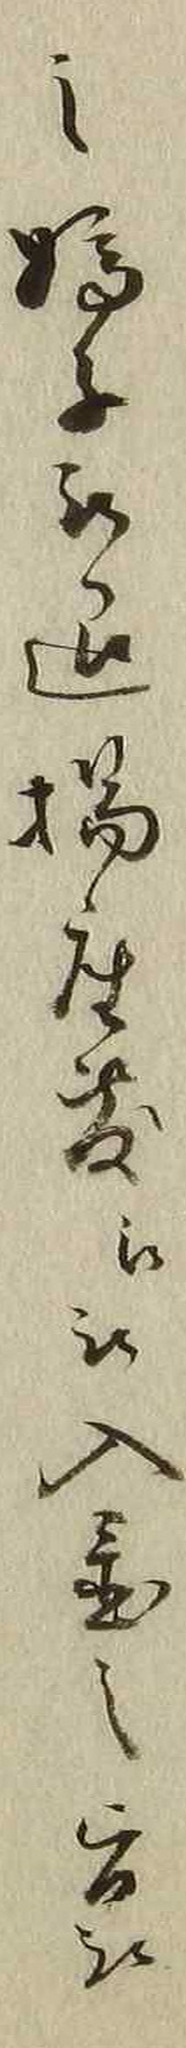之嫡子被退揚座敷江被入置之旨被
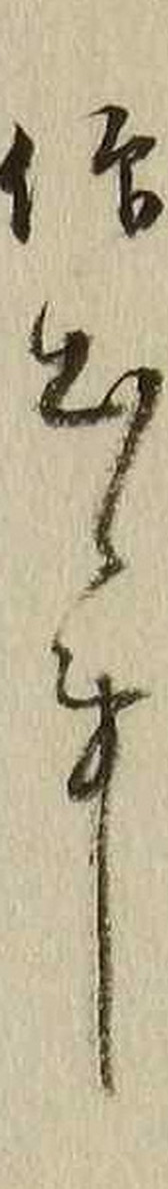仰出候事
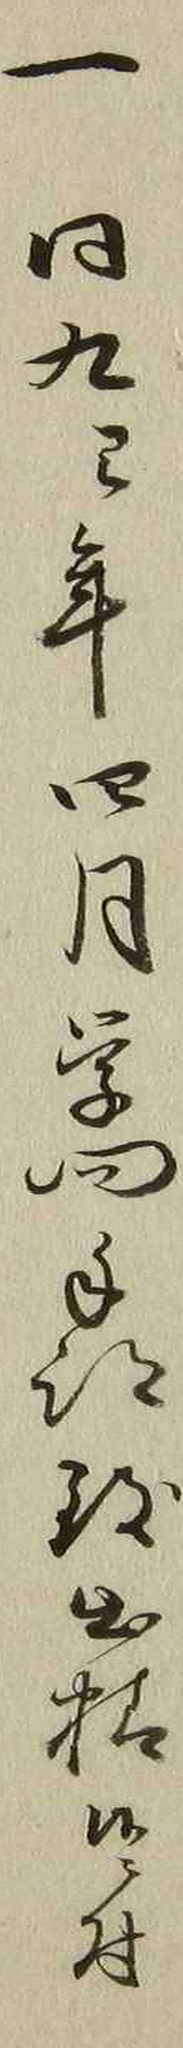一同九巳年四月学問手跡致出精候ニ付
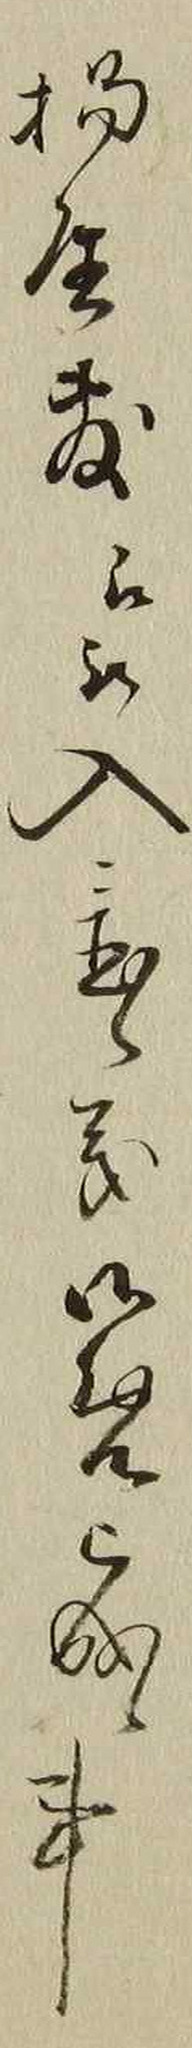揚座敷江被入置候義御免被成候事
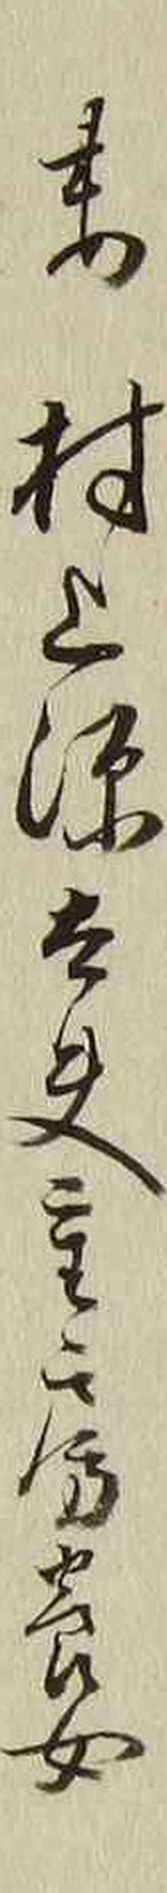妻村上源太夫重房養女
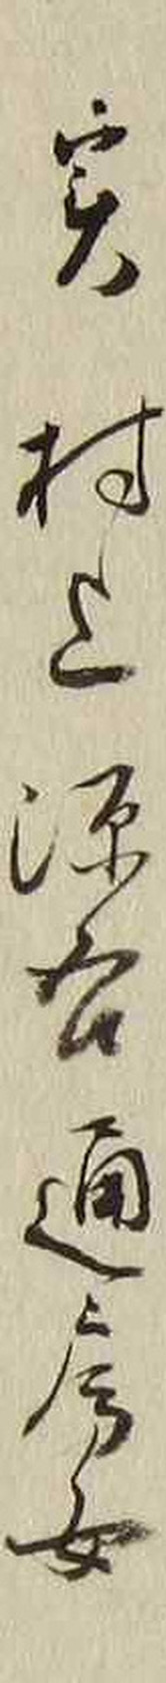実村上源吾通房女
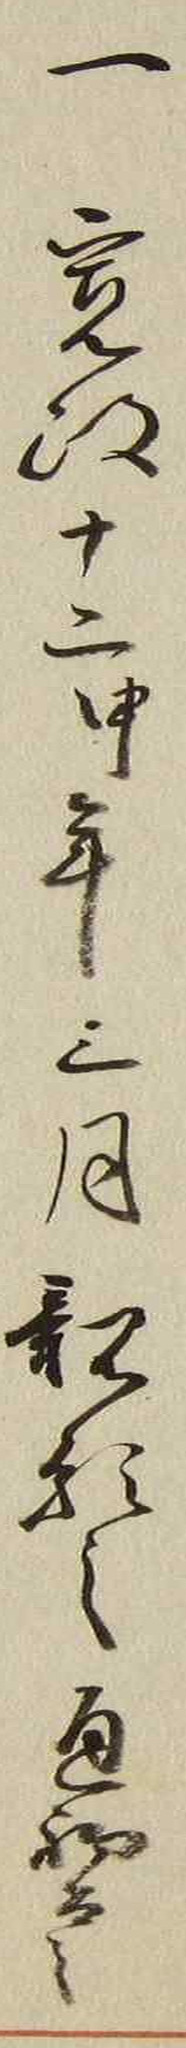一寛政十二申年三月親願之通初而之
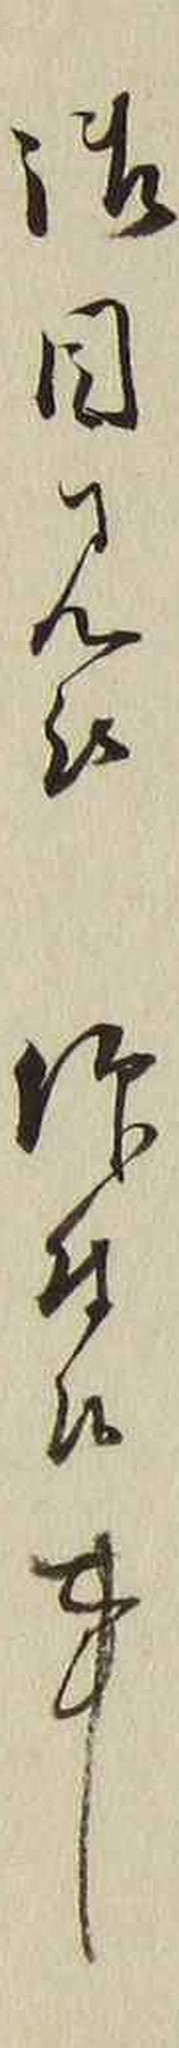御目見被仰付候事
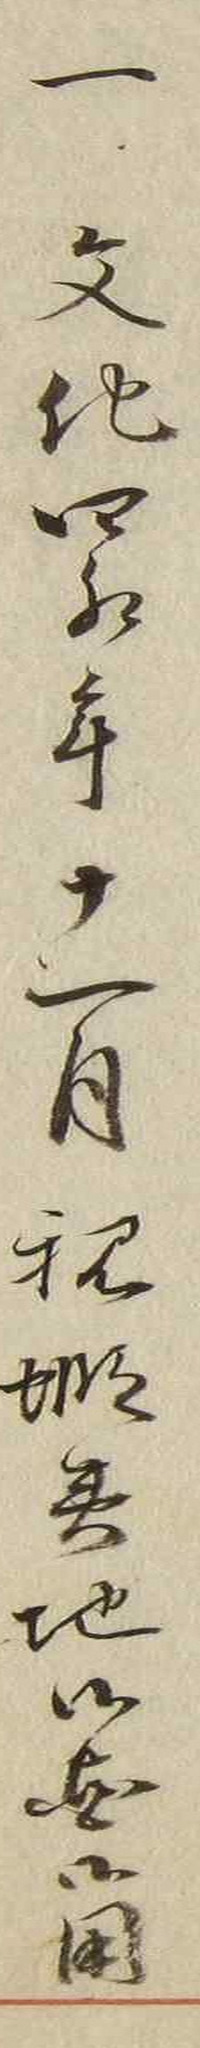一文化四卯年十一月親蝦夷地御固御用

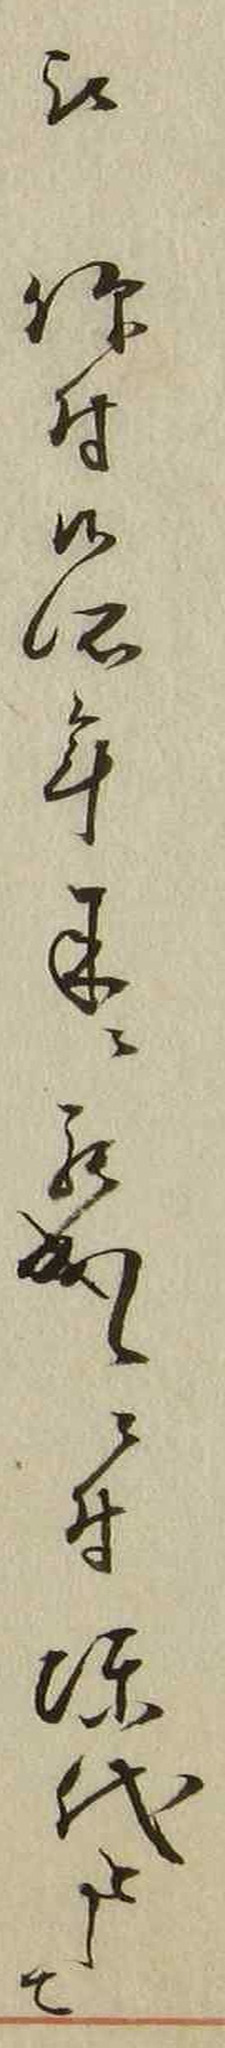被仰付候所年来ニ罷成候ニ付陳代として
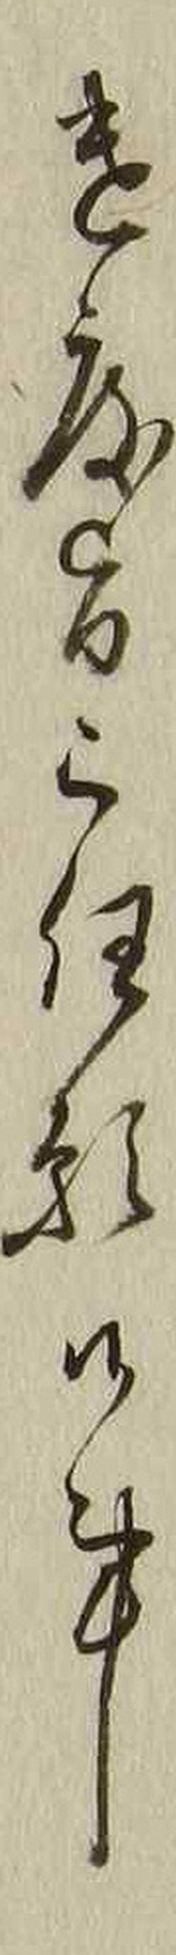遣度旨被任願候事
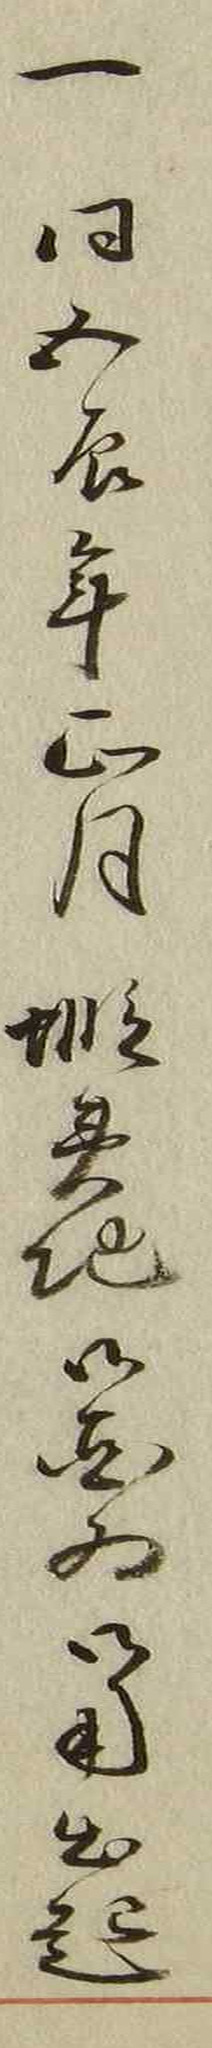一同五辰年正月蝦夷地御固為御用出起
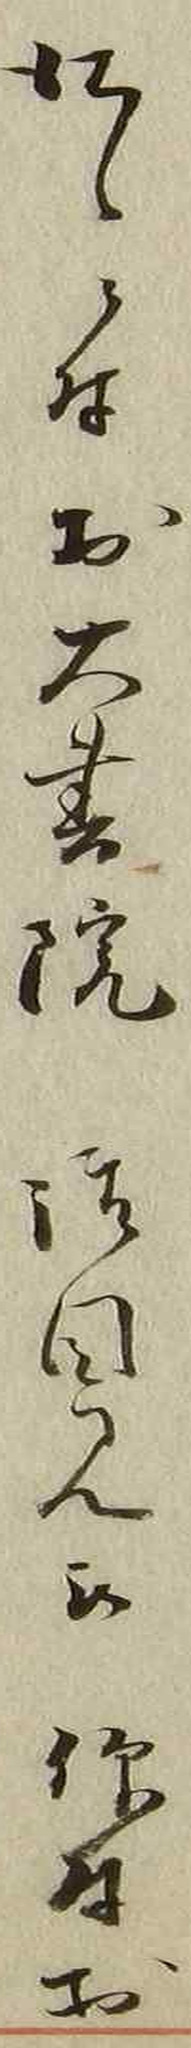仕候ニ付於大書院御目見被仰付於
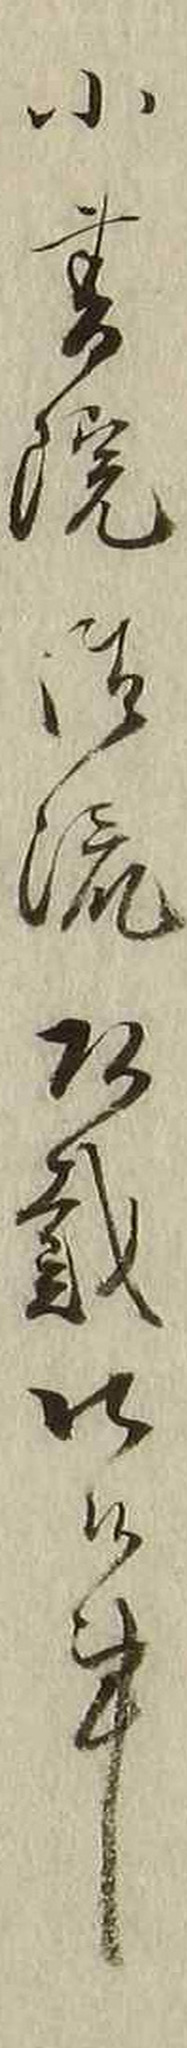小書院御流頂戴仕候事
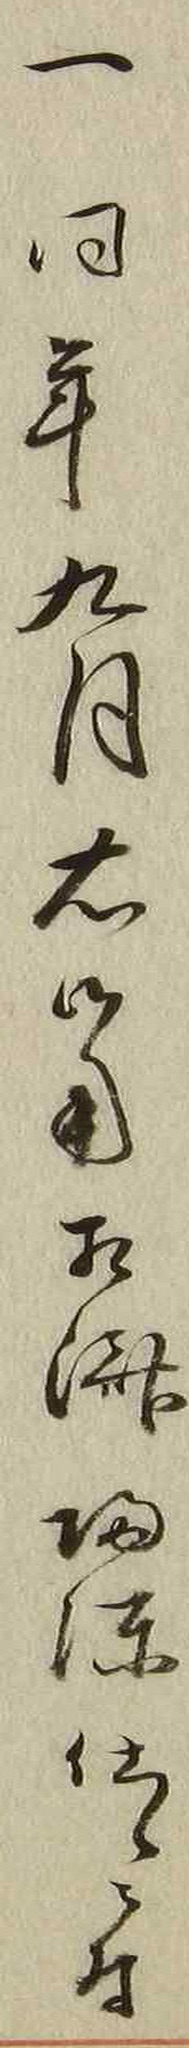一同年九月右御用相済帰陳仕候ニ付
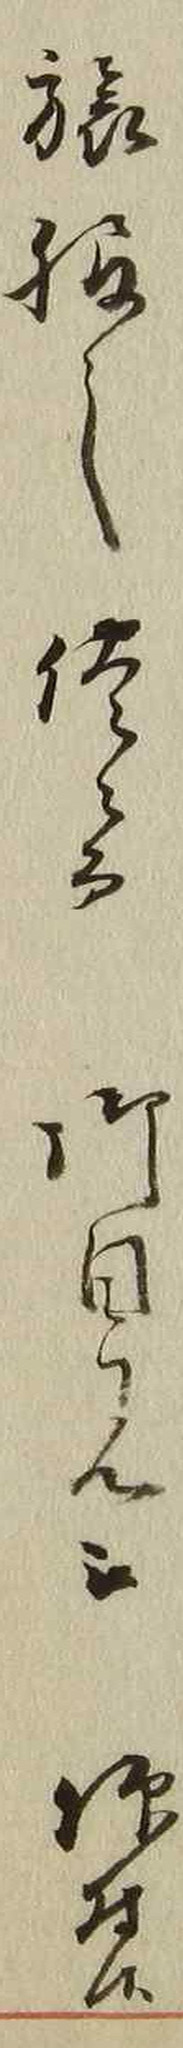旅服之儘ニ而御目見被仰付候
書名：諸士系譜　巻之26　い之部26
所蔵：会津若松市立会津図書館
